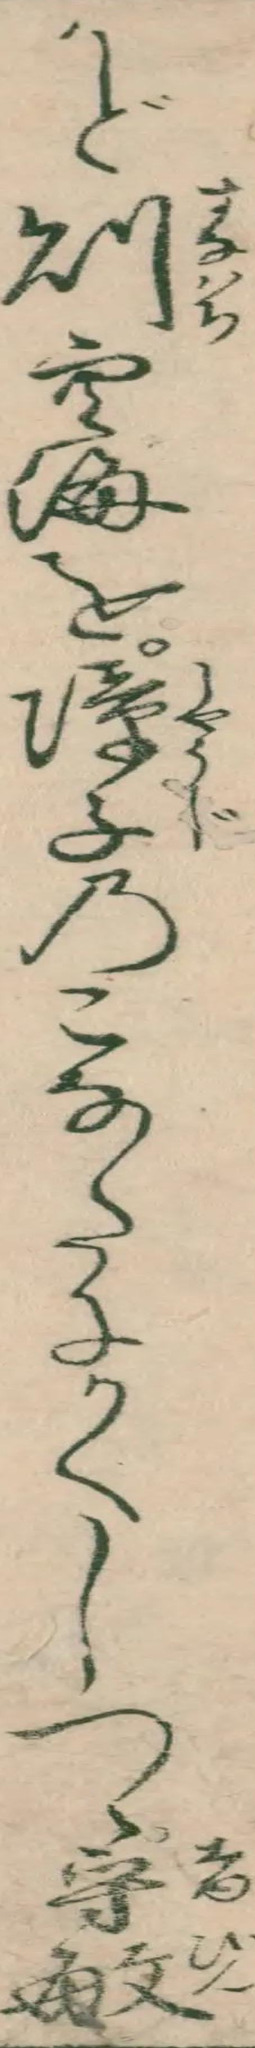かど則空海を障子のこなたにかくしつゝ守敏
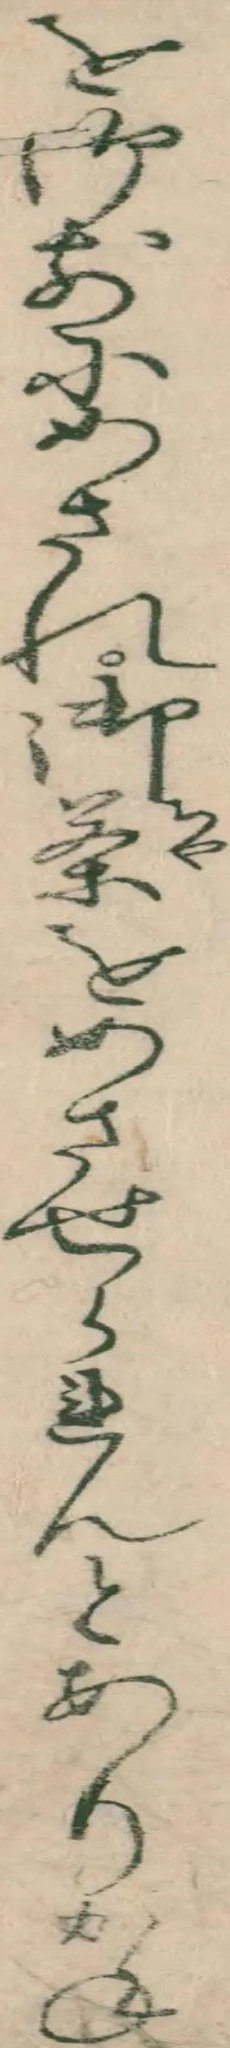を御前にめされ。御茶をめさせられんとありかね
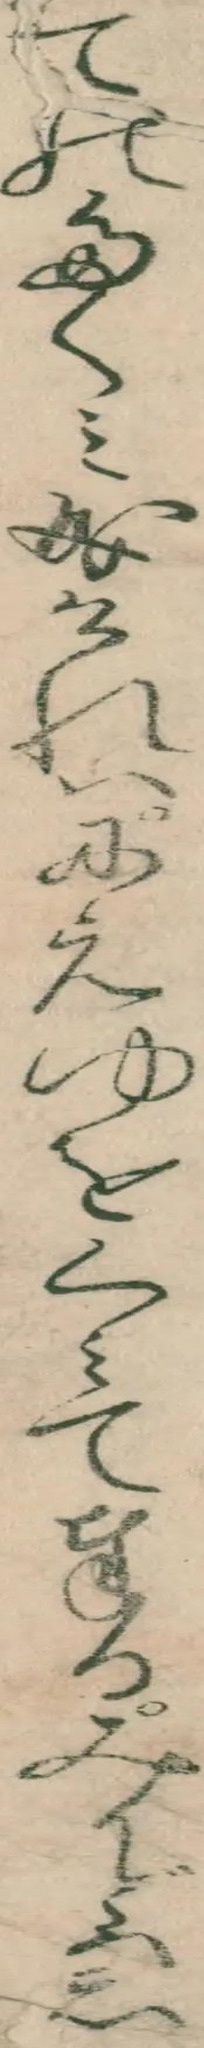てのたくみ成けれは。にえゆをくみて奉る。みかどはし
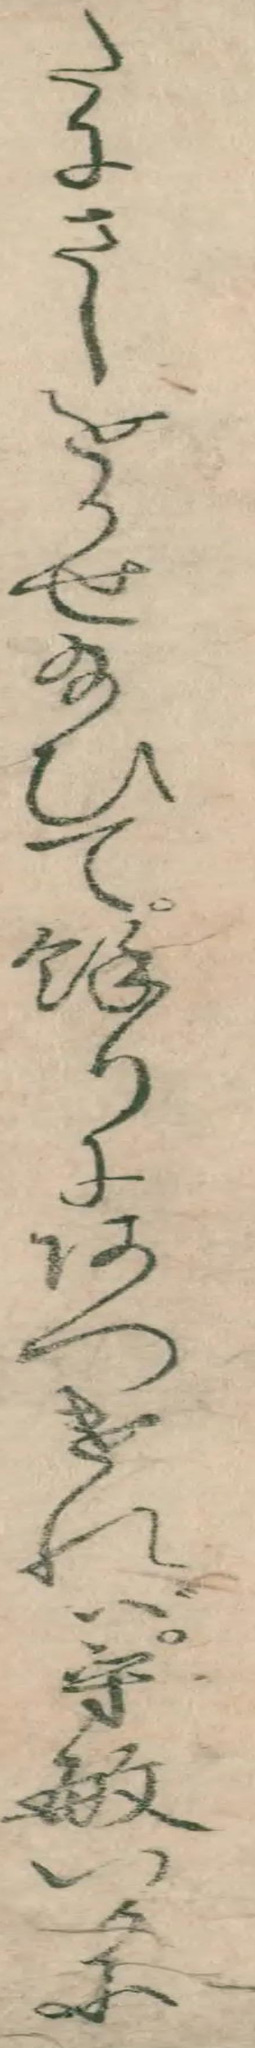たにさしをかせ給ひて。余りにあつけれは。守敏いかに
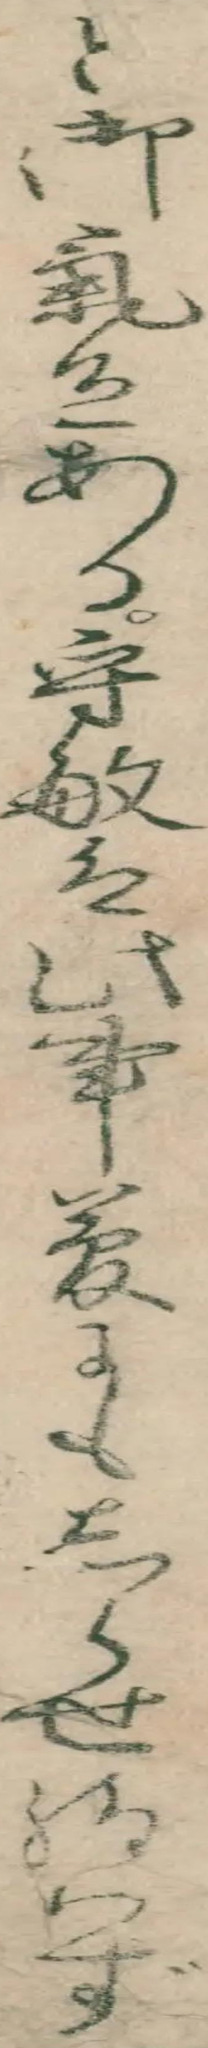と御気色ある。守敏は此事夢にもしらせ給はず
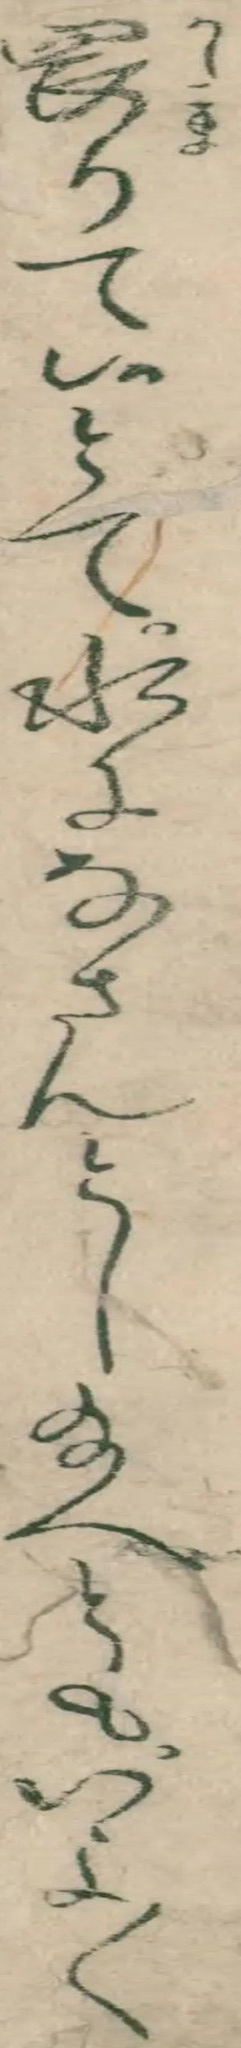畏りて候とて。水になさんとし給へとも。いよ〳〵

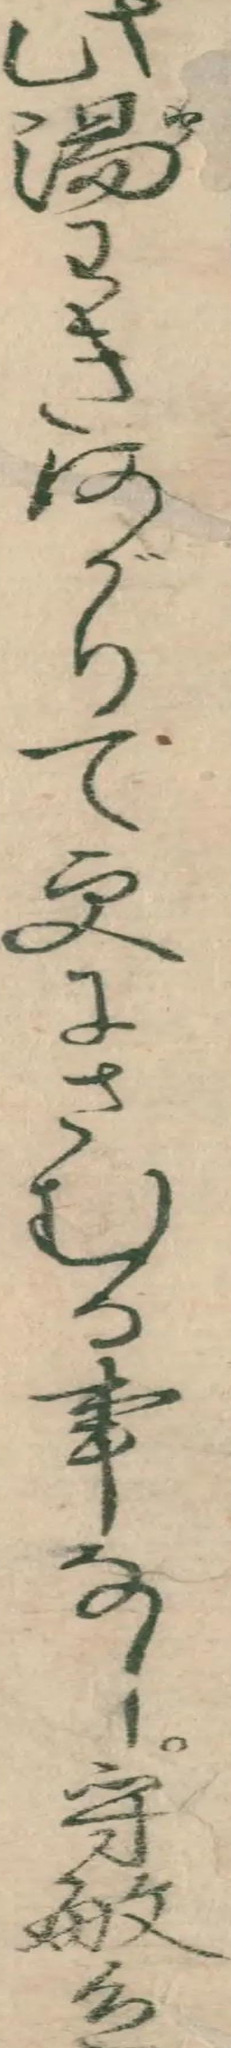此湯わきあがりて更にさむる事なし。守敏色
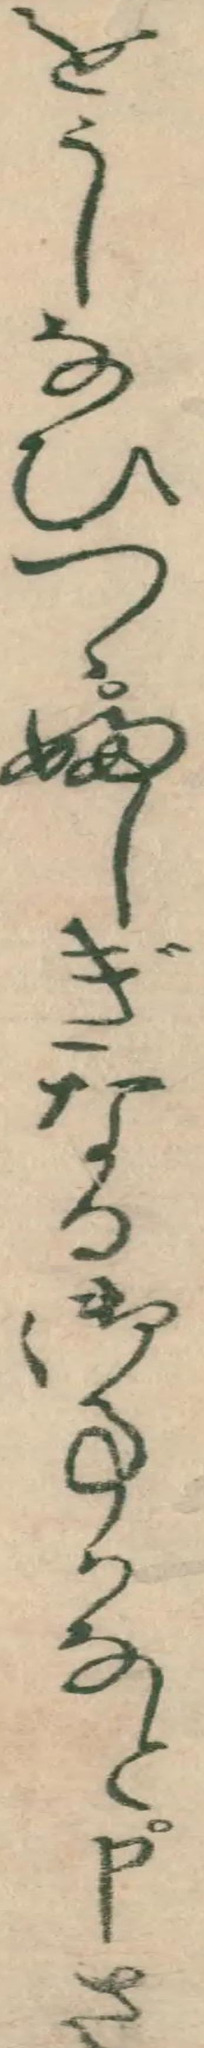をうしなひつゝ。ふしぎなる御事かなと。申さ
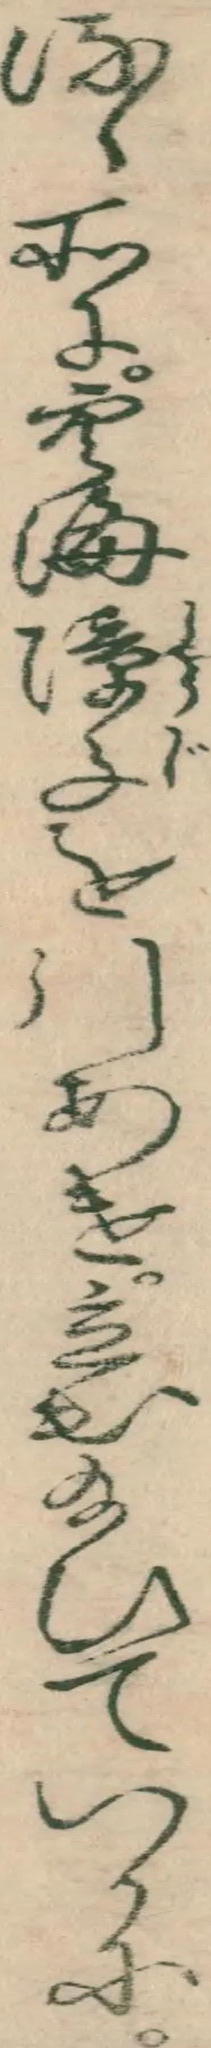るゝ所に。空海障子を引あけ。立出給ひていかに。
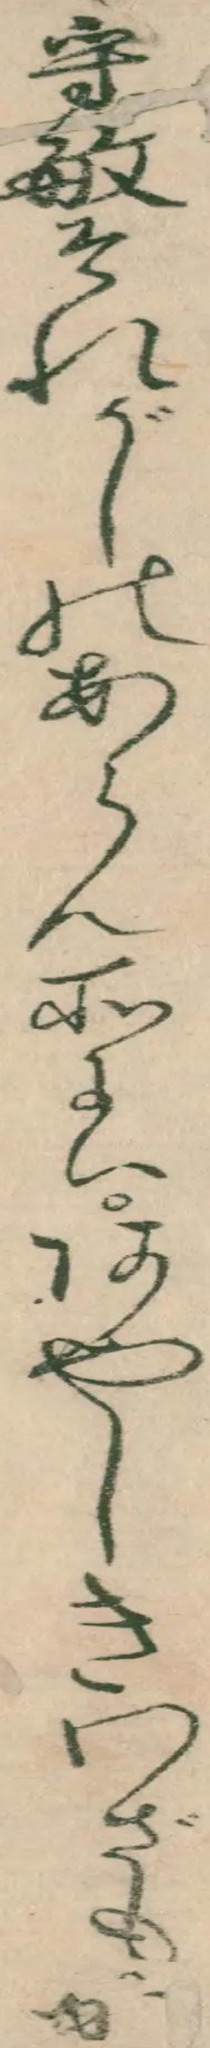守敏それがしのあらん所には。あやしきわざも。か
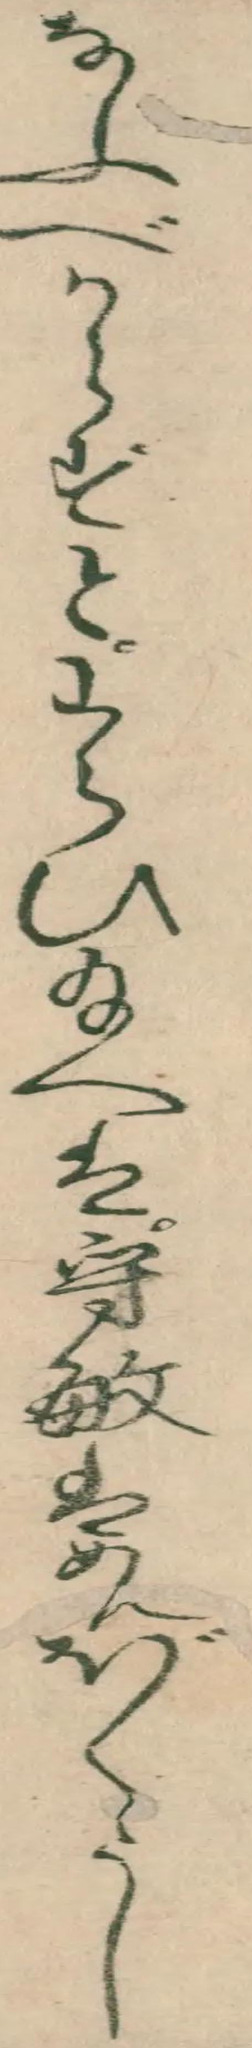なふべからずと。わらひ給へは。守敏はめんぼくうし
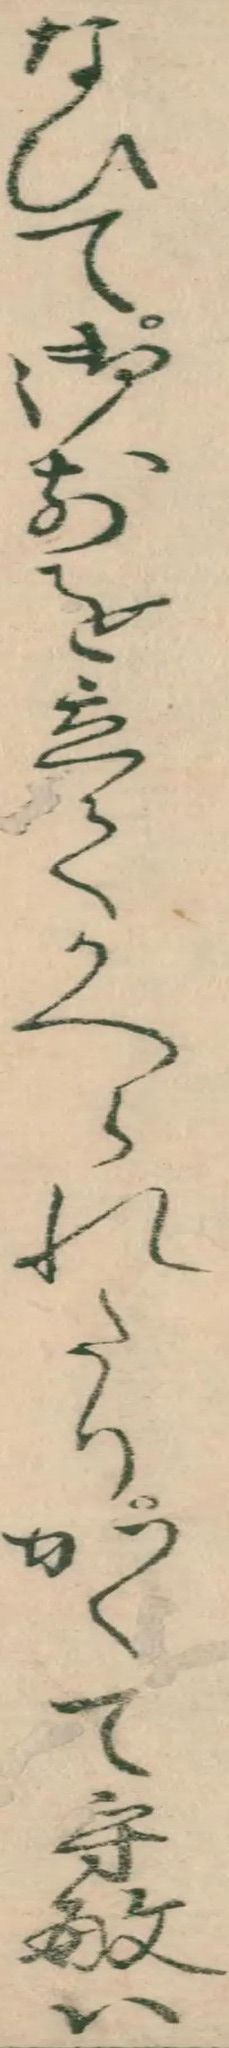なひて。御前を立てかへられたり。かくて守敏は
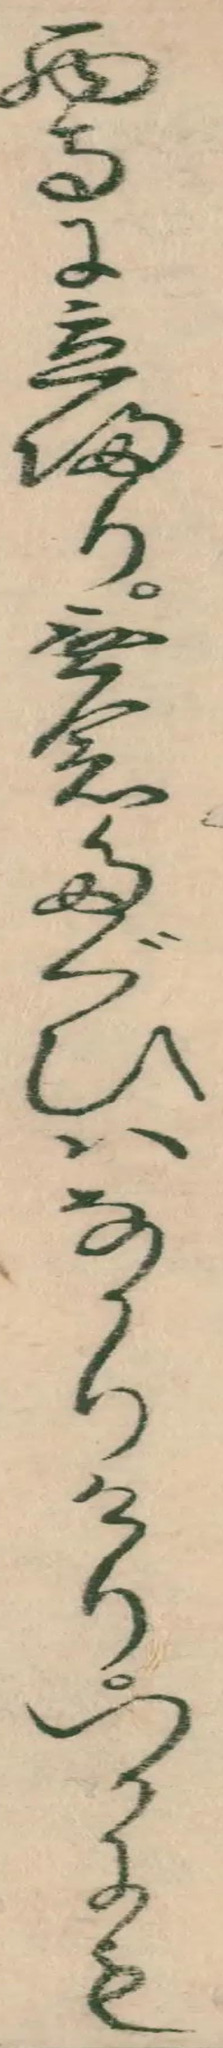西寺に立帰り。無念たぐひはなかりけり。いかにも
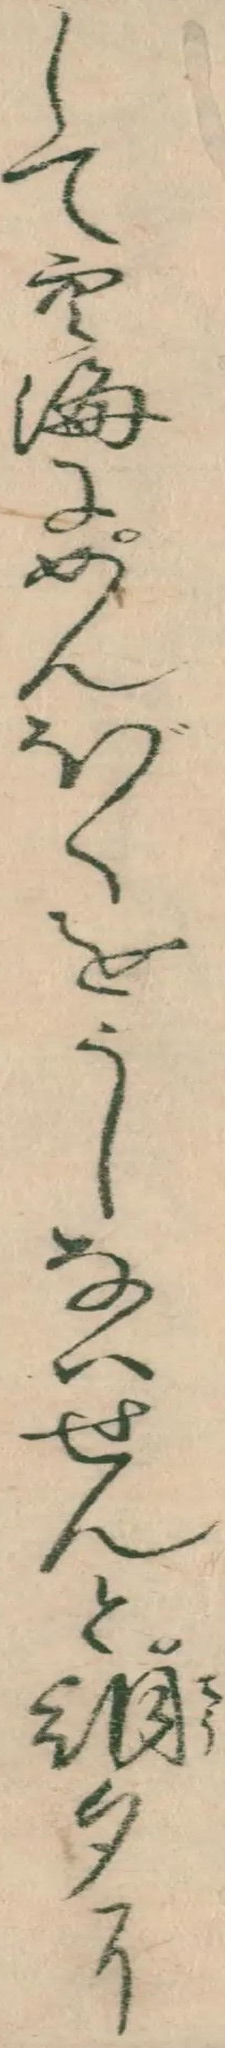して空海にめんぼくをうしなはせんと。朝夕に
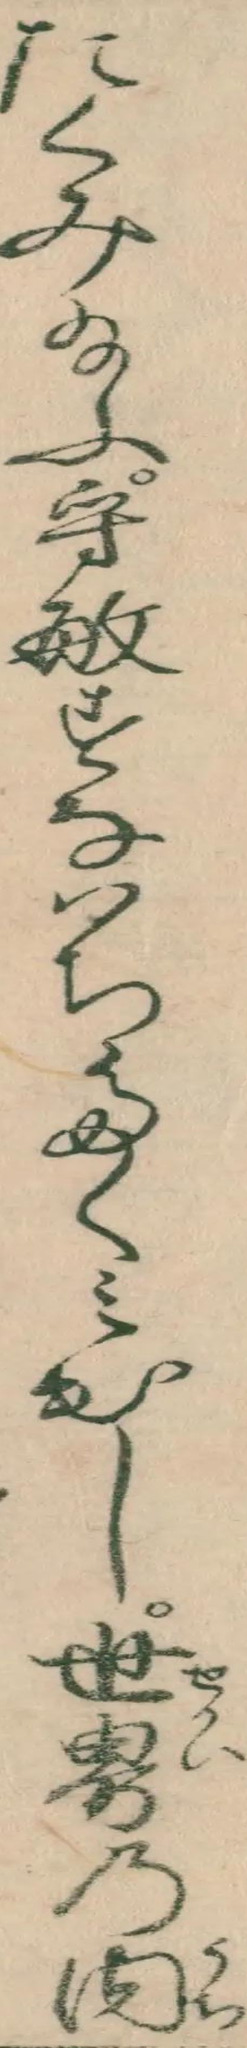たくみ給ふ。守敏すなはちたくみ出し。世界の内
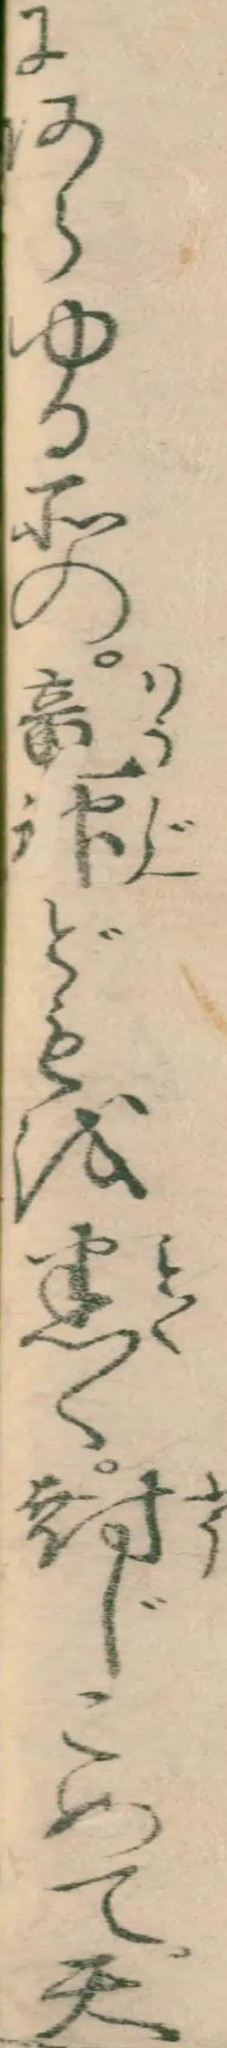にあらゆる所の竜神どもを悉く。封じこめて。天
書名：弘法大師御本地 3巻. [2]
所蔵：国立国会図書館 National Diet Library, JAPAN
